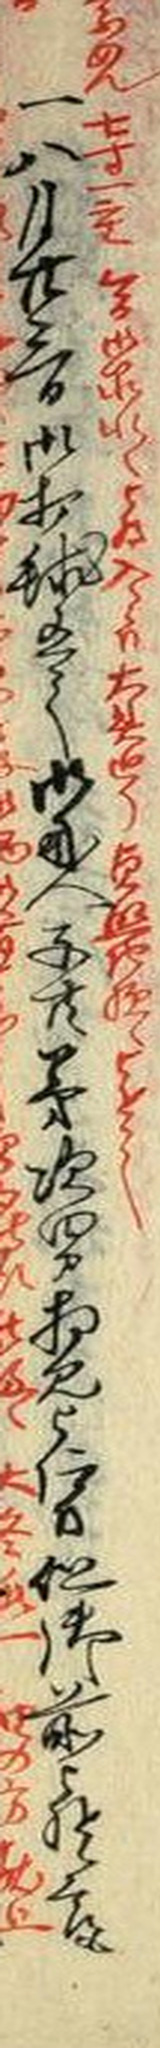一八月廿三日御打毬有之御用人子共弟次男拝見被仰付但御前被遊候節も
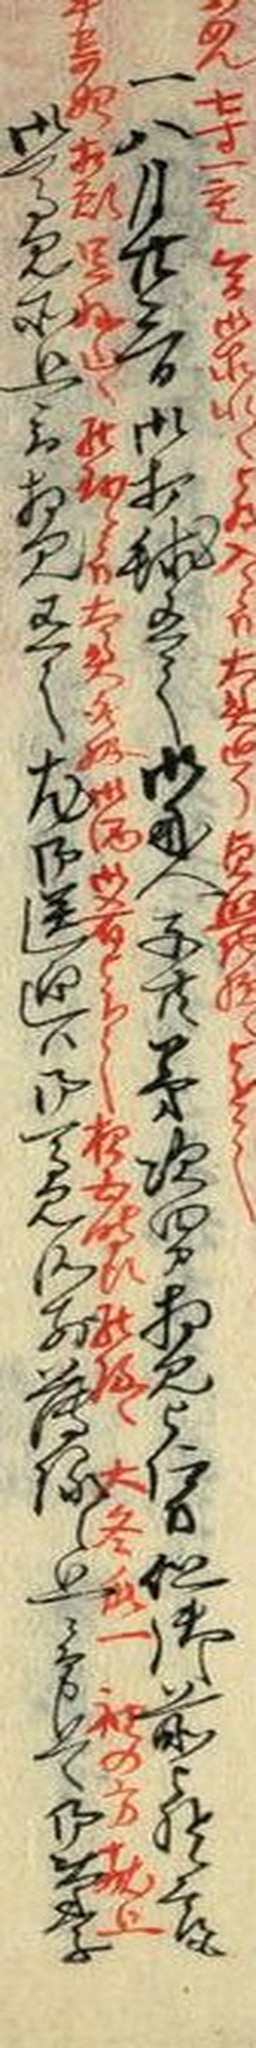御馬見所上ニ而拝見有之尤御送迎ハ御馬見所前薄縁之上ニ而申上候御菓子
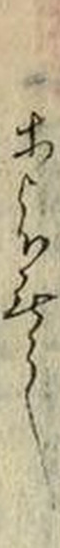等被下無之
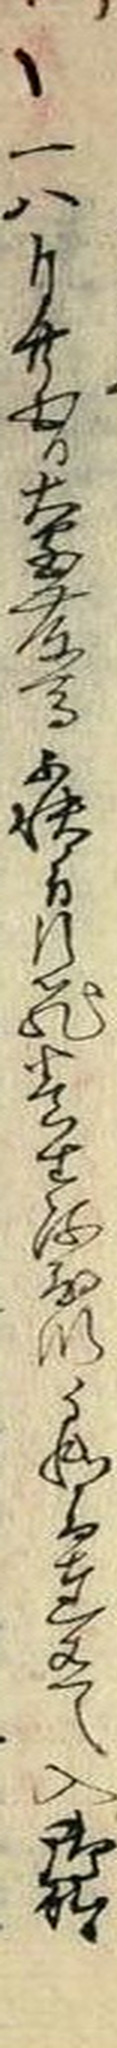一八月廿五日大宮藤馬不快ニ付引籠養生致度段手紙ニ而達有之入御聴候
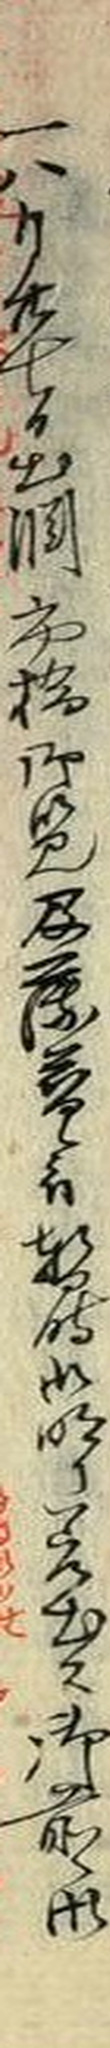一八月廿七日出淵市橋御覧及薄暮候ニ付暫時御明り差出ス御前へ御
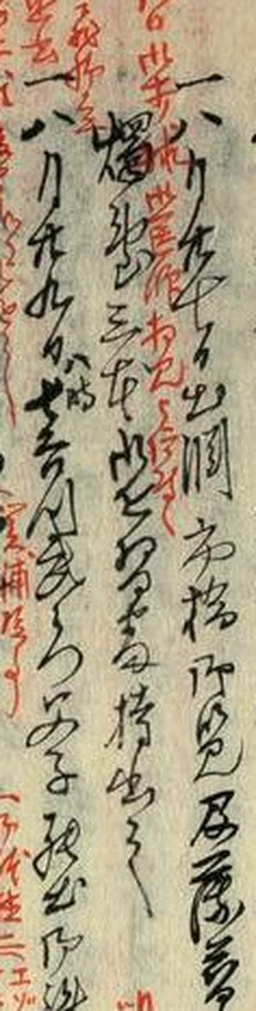燭台三本御近習番持出之
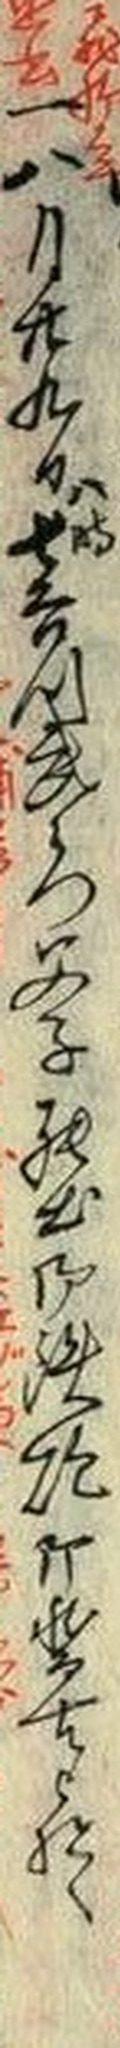一八月廿九日八時長谷川武右衛門父子罷出御鉄炮御稽古被遊候
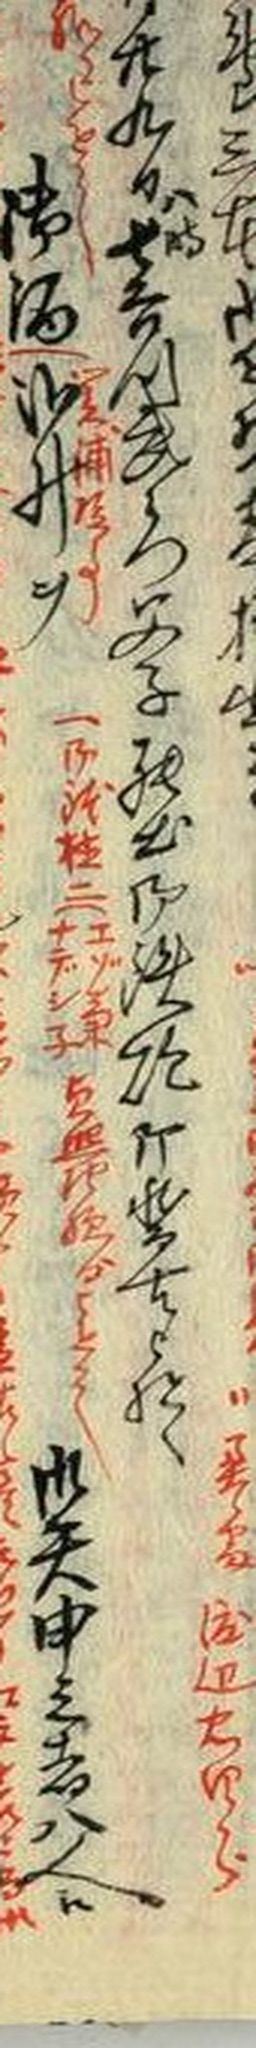御酒弐升ヲ御矢申之者八人江
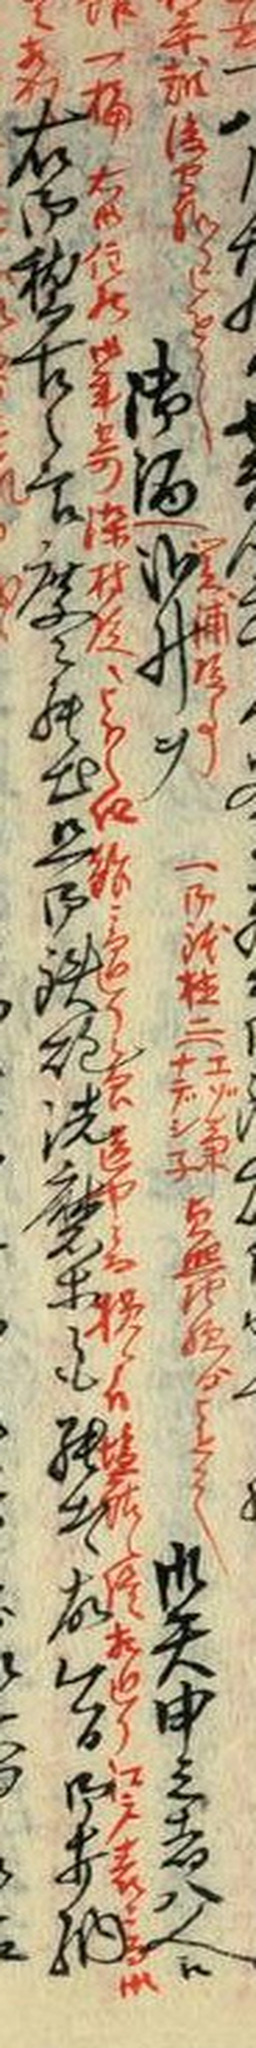右御稽古之節度々罷出且御鉄炮洗磨等ニも罷出候故今日御打納
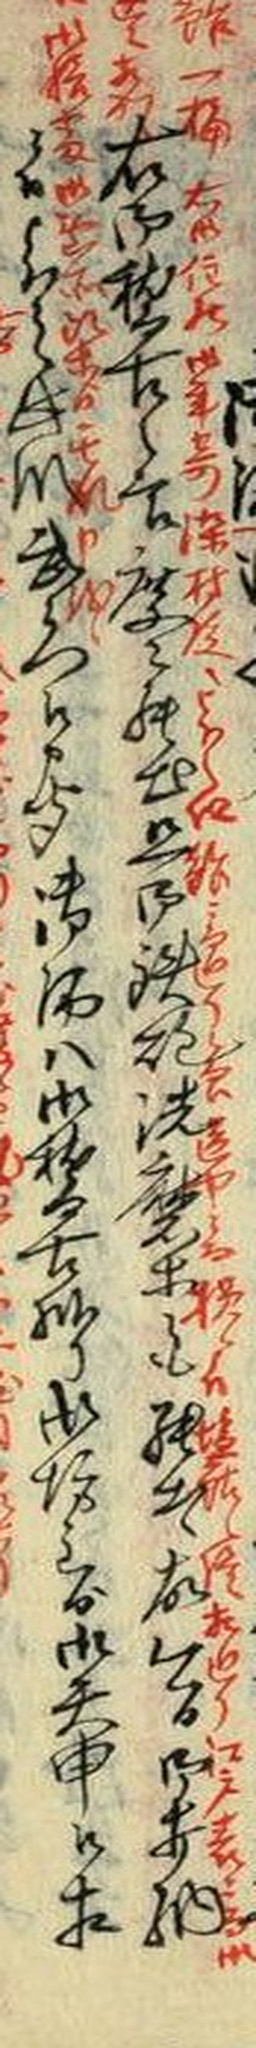ニ付被下之此段武右衛門江申聞御酒ハ稽古掛り御坊主ゟ御矢申江相
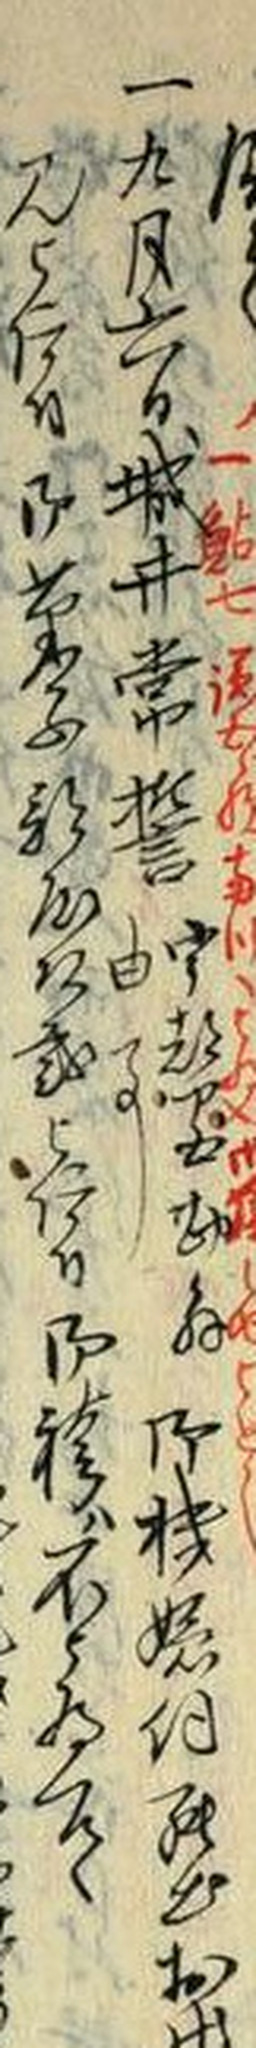見被仰付御菓子部屋頂戴被仰付御袴ハ不被為召候
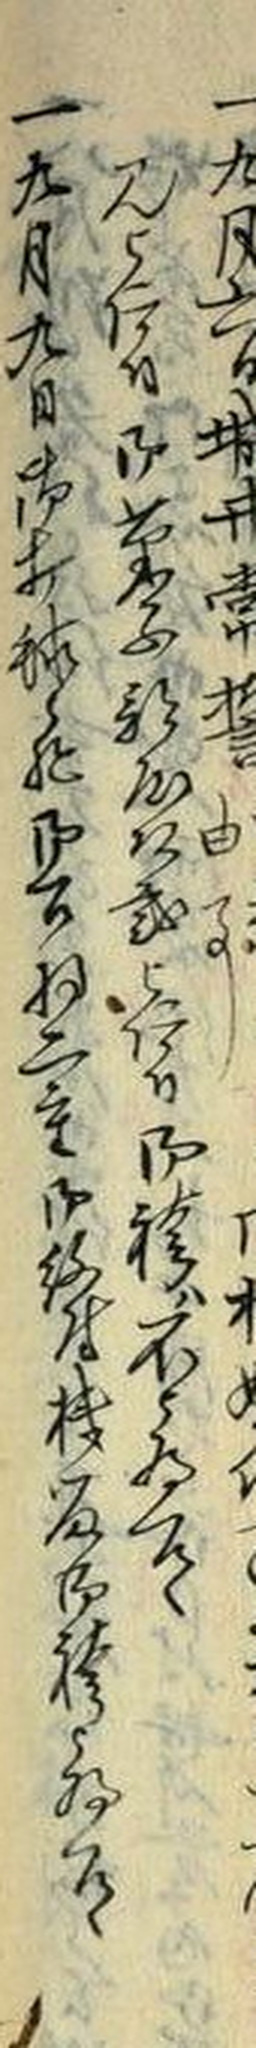一九月九日御打毬被遊御召羽二重御紋付桟留御袴被為召候
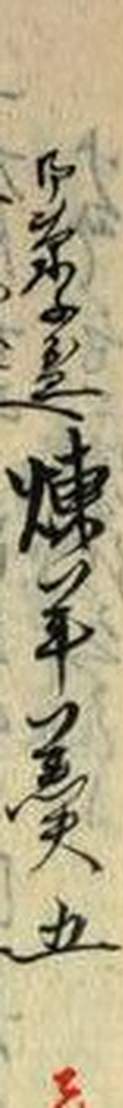御菓子盆煉羊羹五
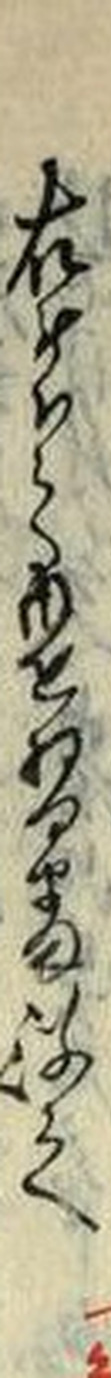右被下之御近習番役之
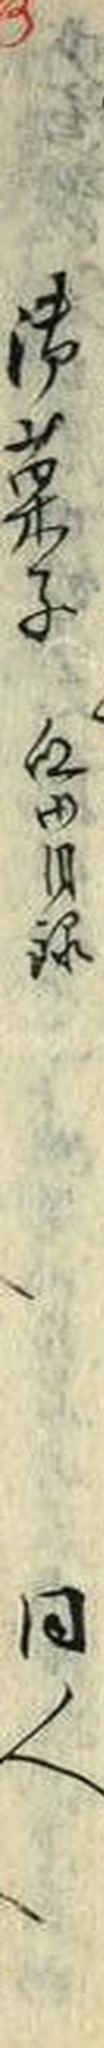御菓子但御目録同人
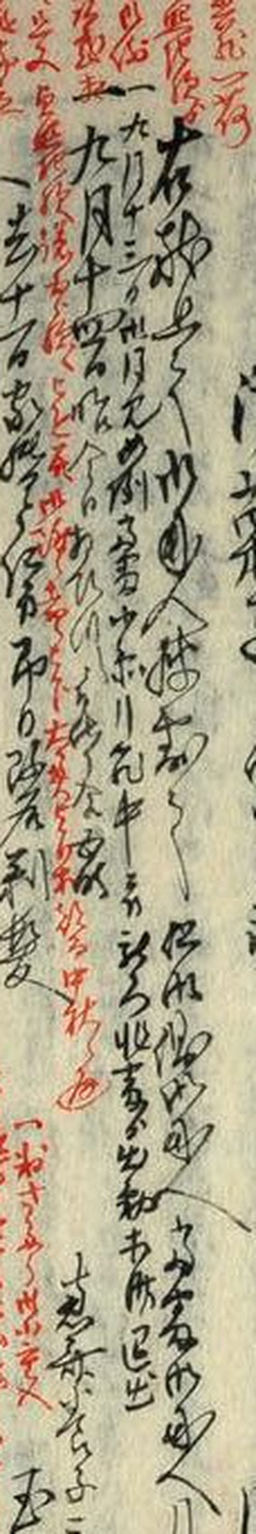一九月十三日御月見如例当番小兵衛引籠中ニ付新右衛門非番ゟ出勤相済退出
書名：少傅日録抄（斉承付側向頭取日記、在国）
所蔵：福井県文書館 Fukui Prefectural Archives
